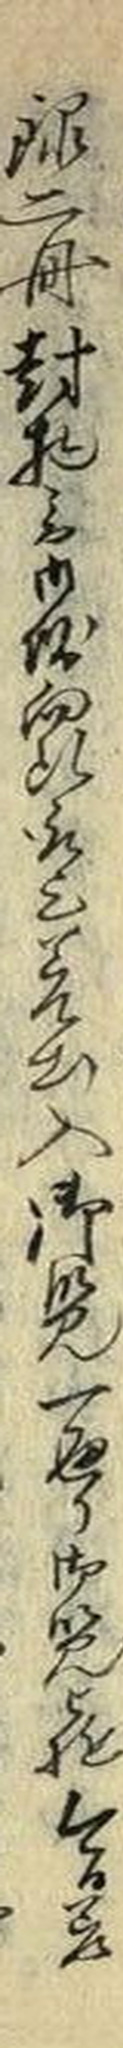録二冊封物ニ而御側向頭取迄差出入御覧一通り御覧被遊今日差
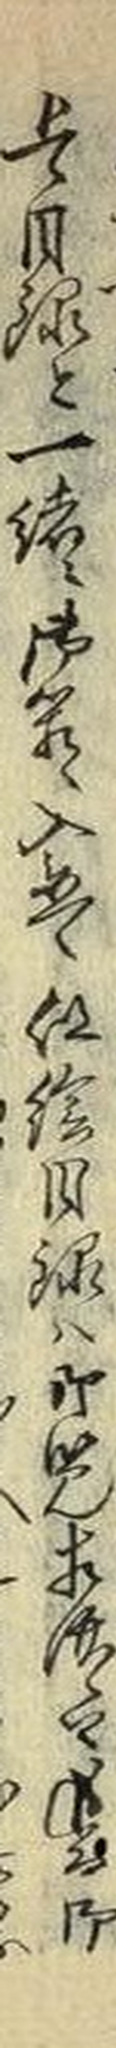上候目録と一緒ニ御箱へ入置候但絵目録ハ御覧相済候ハヽ追而御
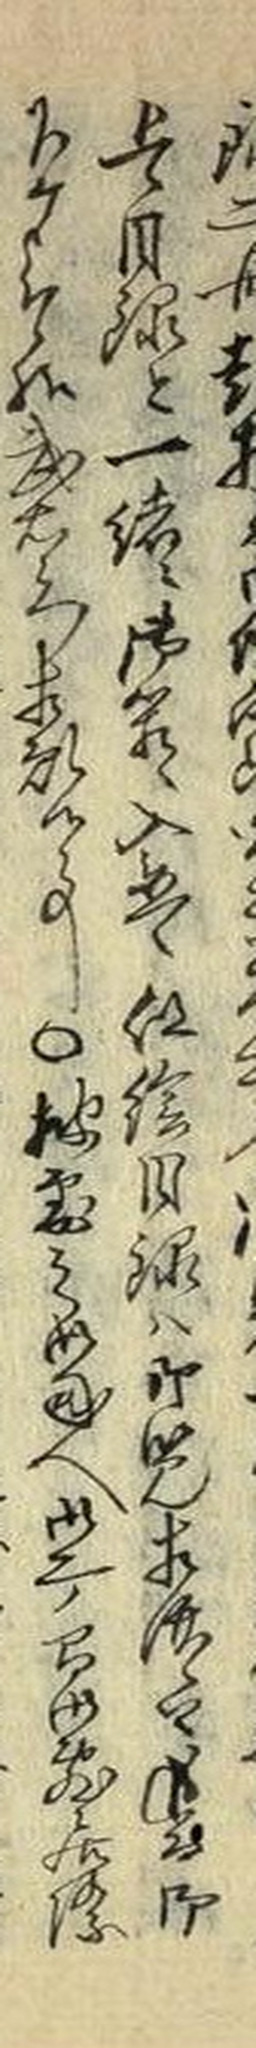下ケ被下候様武右衛門相願候事〇披露之御用人御二ノ間御敷居際
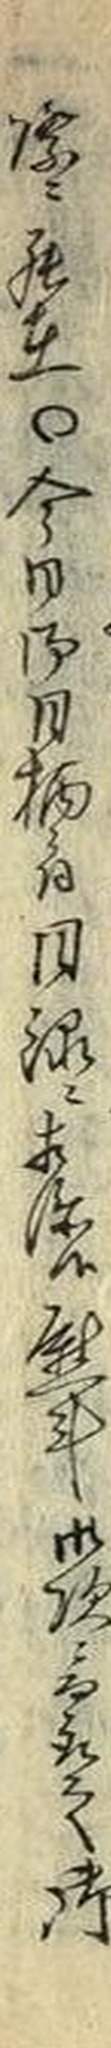際ニ罷在〇今日御日柄ニ付目録ニ相添候熨斗御次ニ而取之御
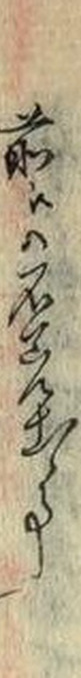前江ハ不差出候事
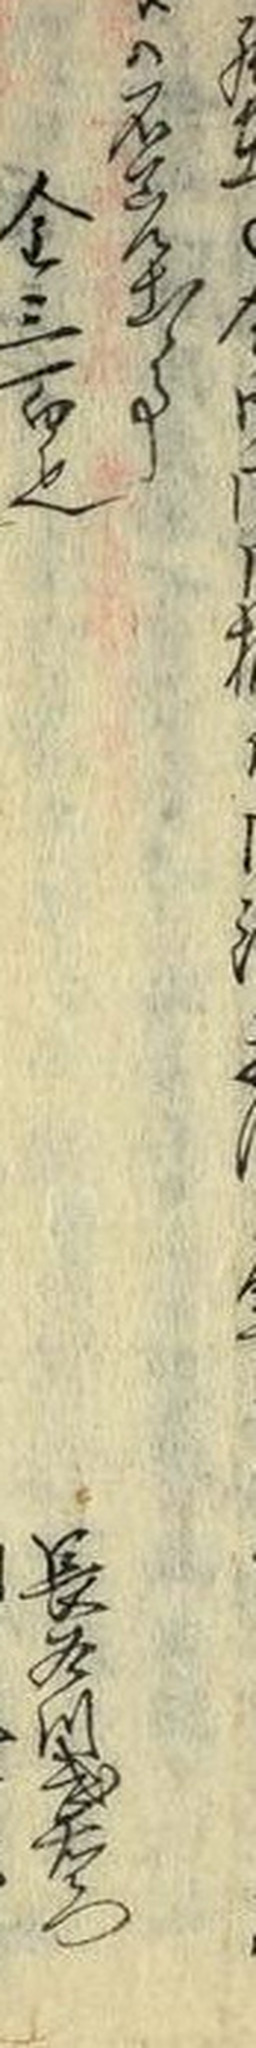金三百疋長谷川武右衛門
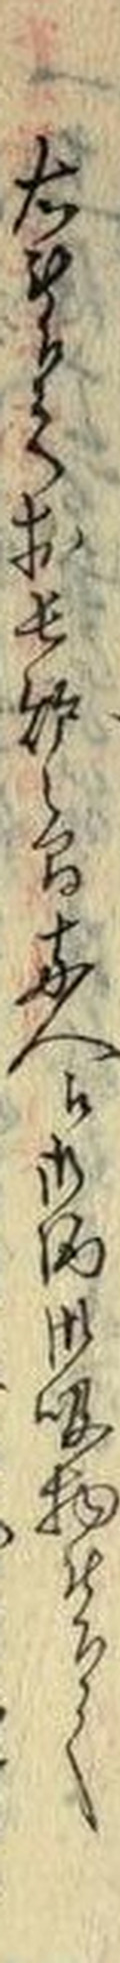右被下之於長炉之間両人江御酒御吸物被下之
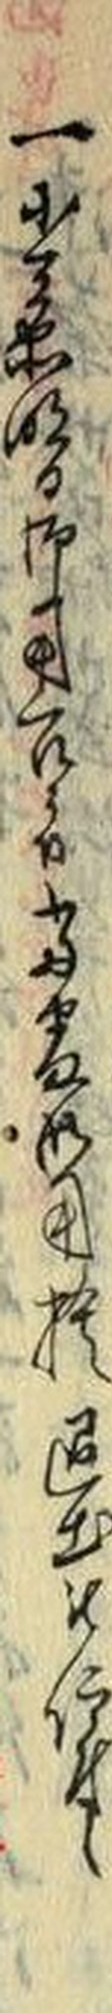一小兵衛明日御用召ニ付当番御用捨退出被仰付候
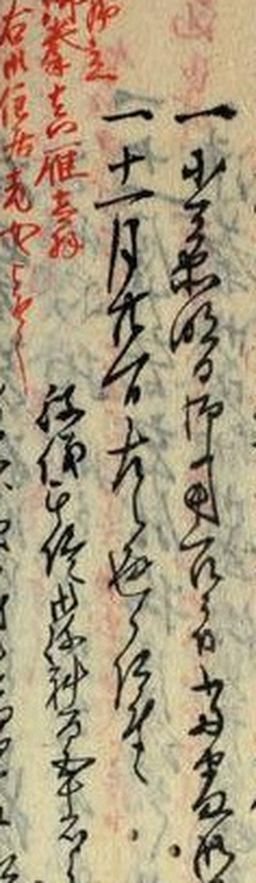一十一月廿一日左之通被仰付候
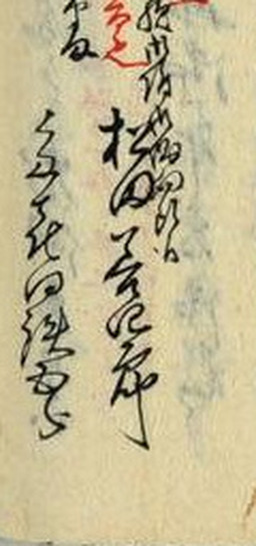松田善四郎
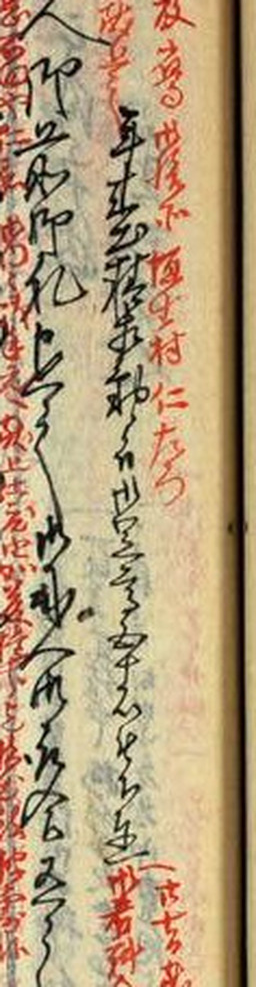年来出精相勤候ニ付御足高五十石被下置
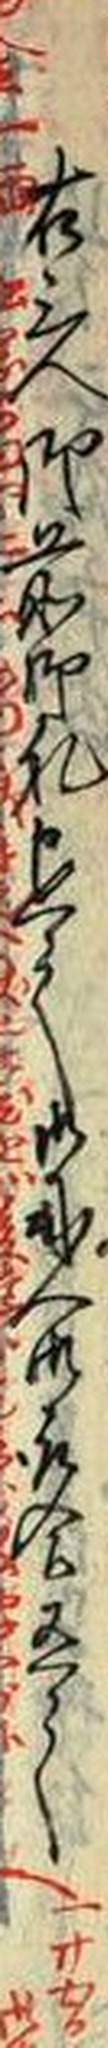右三人御前御礼申上之御用人御取合有之
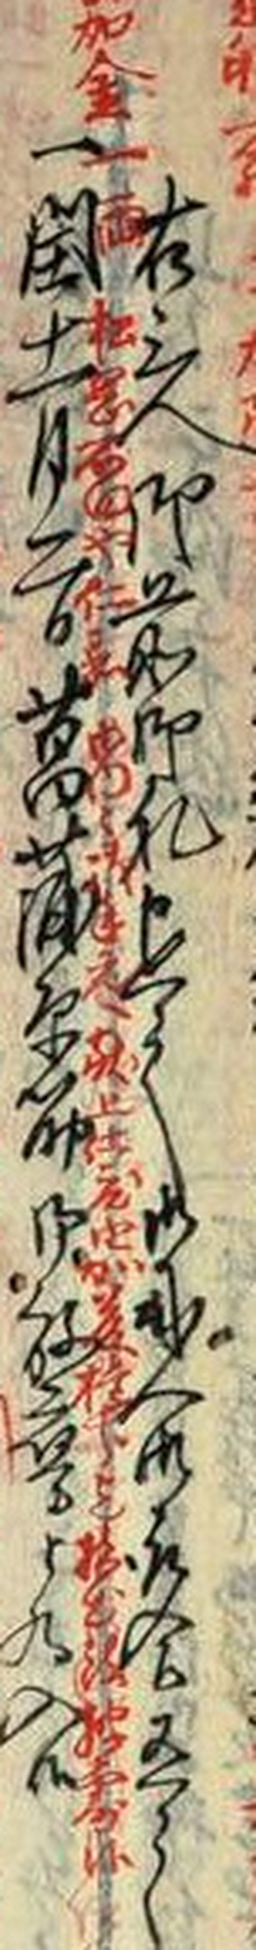一閏十一月二日菖蒲原筋御放鷹被為入候
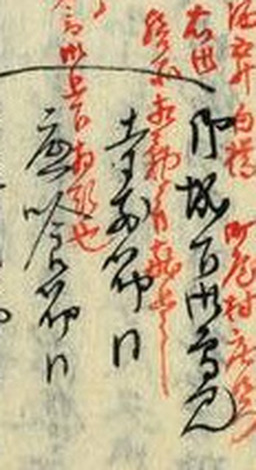寺前筋同
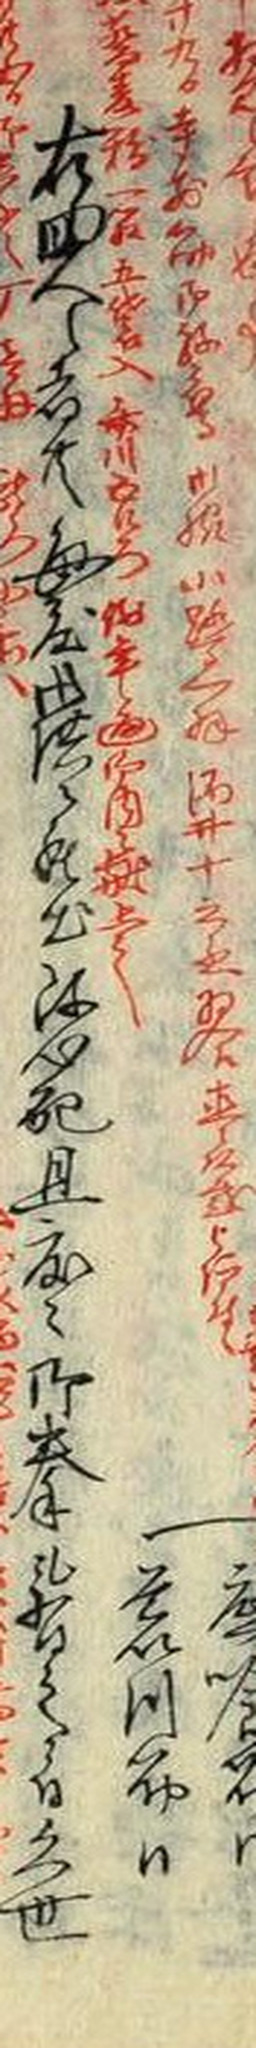右四人之者共毎度御供ニ罷出致心配且度々御拳も有之ニ付久世
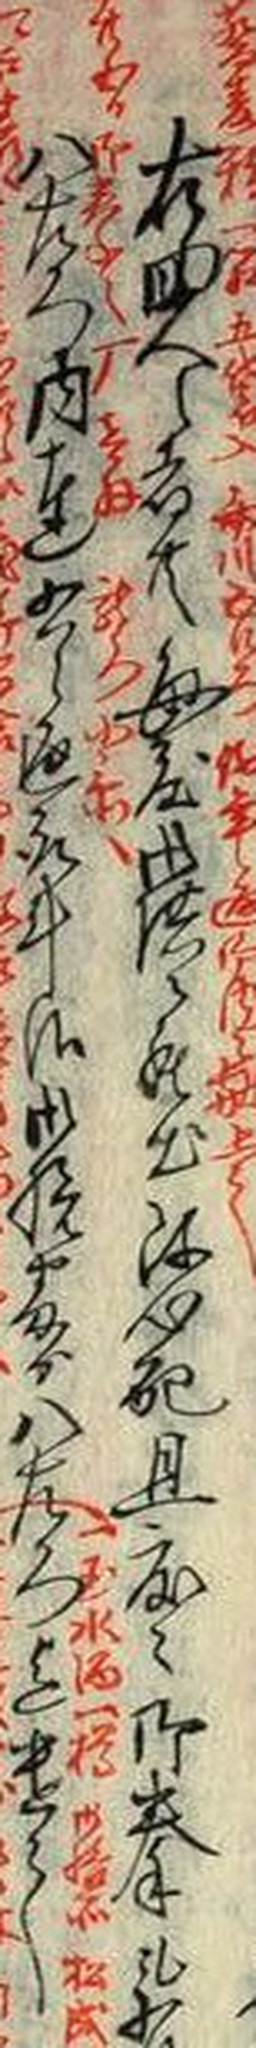八左衛門内達右之通取計候御膳番ゟ八左衛門迄遣之
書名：少傅日録抄（斉承付側向頭取日記、在国）
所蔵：福井県文書館 Fukui Prefectural Archives
